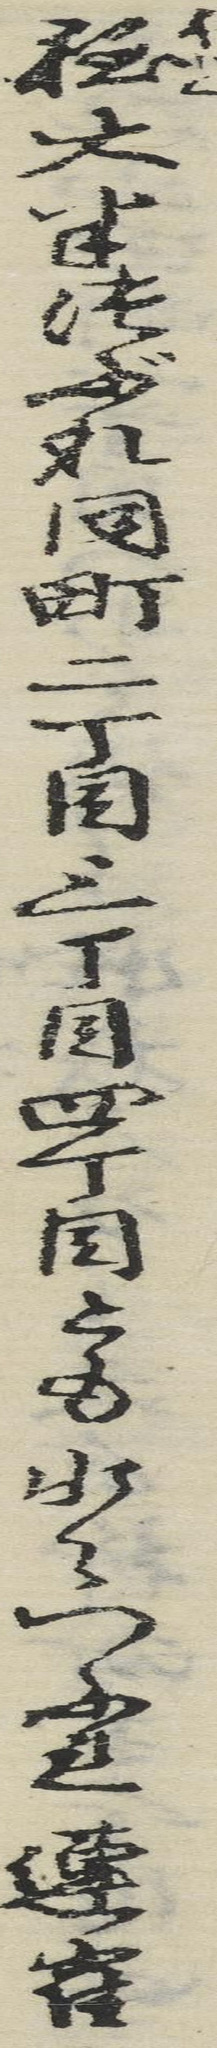程大半つぶれ同町二丁目三丁目四丁目とも少々つふれ連雀
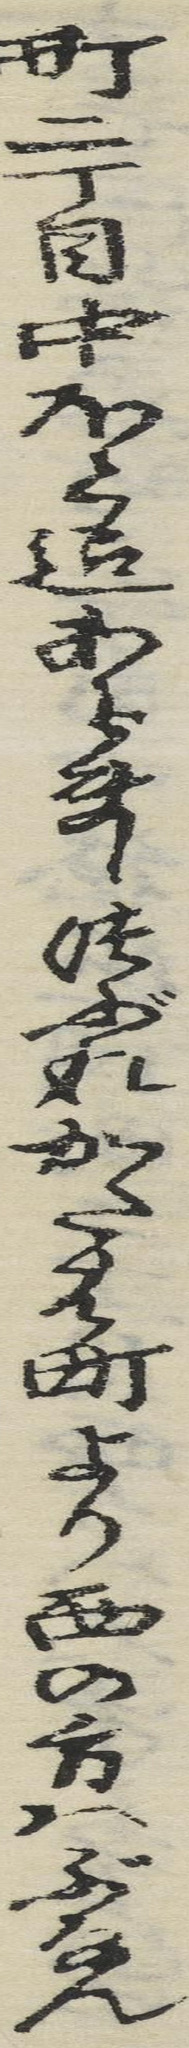町二丁目中ほと迄あらましつぶれかたえ町より西の方はぶなん
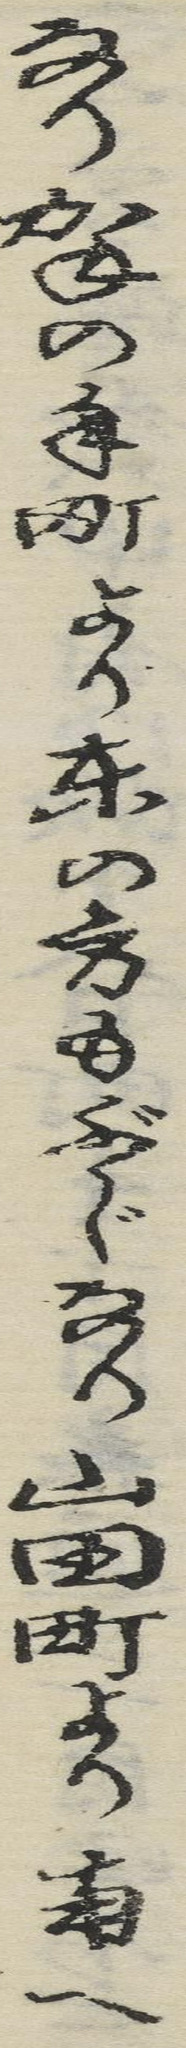なりかねの手町より東の方もぶじなり山田町より南へ
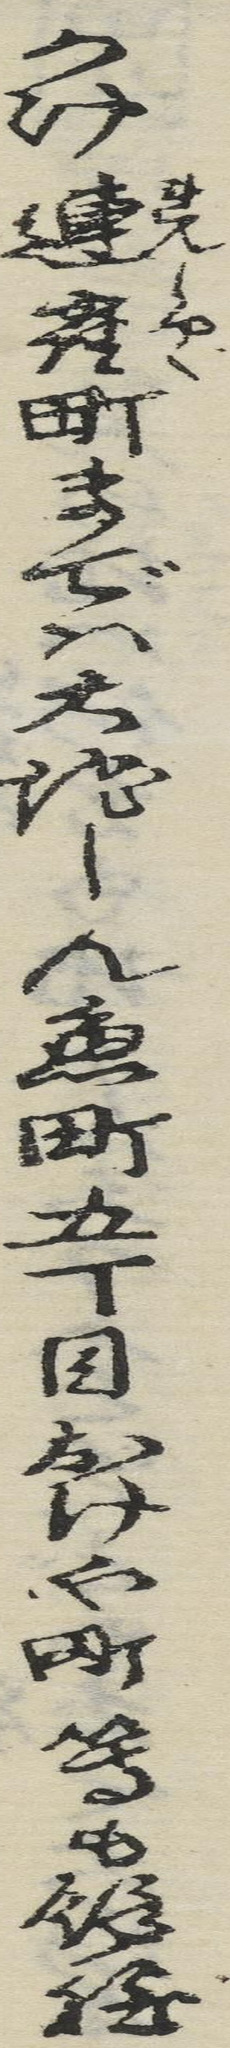かけ連雀町までは大地しん魚町五丁目おけや町等も余程
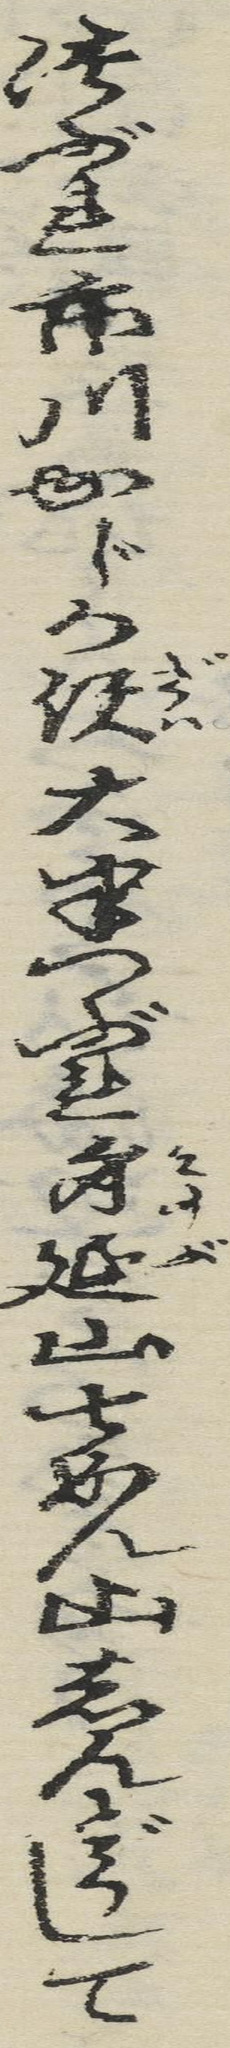つぶれ市川かじか沢大半つぶれ身延山七めん山しんどうして
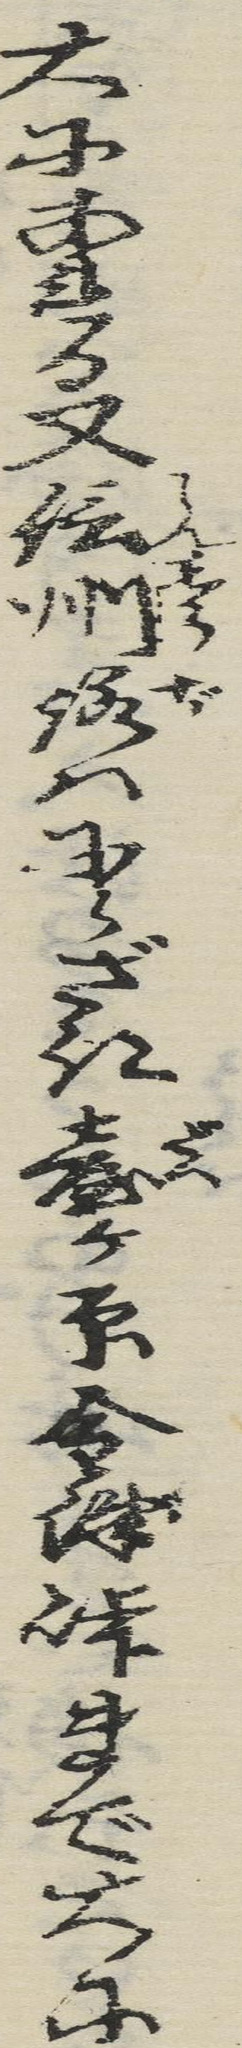大にあれる又信州路はにらざき台ケ原金沢峠まで大に
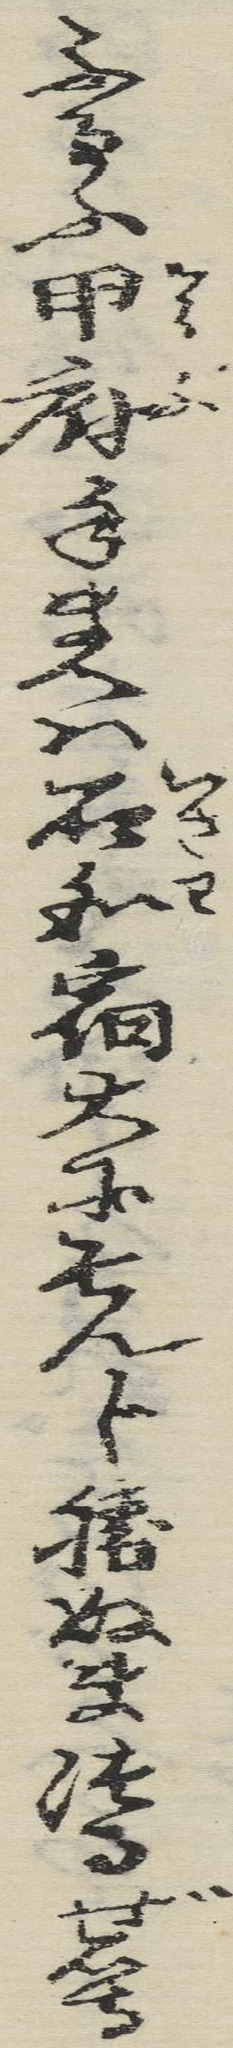ふるふ甲府手まへは石和宿大にそんじ勝ぬまつるぜ等
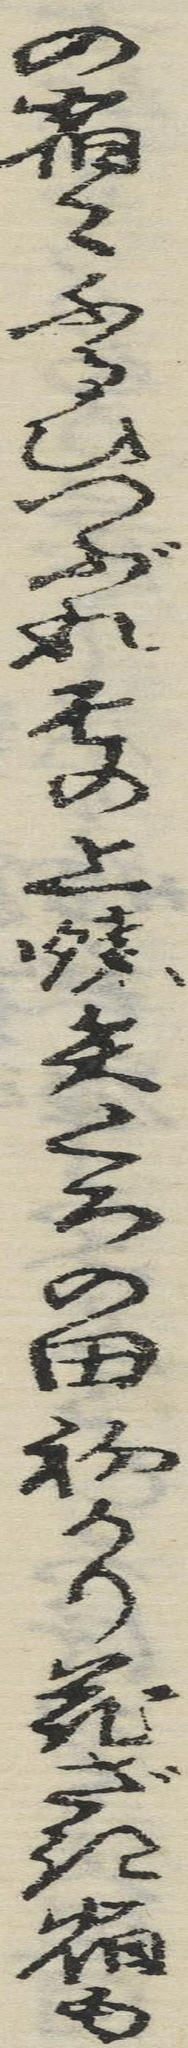の宿々ふるひつぶれその上焼失くろの田物初かり花ざき宿も
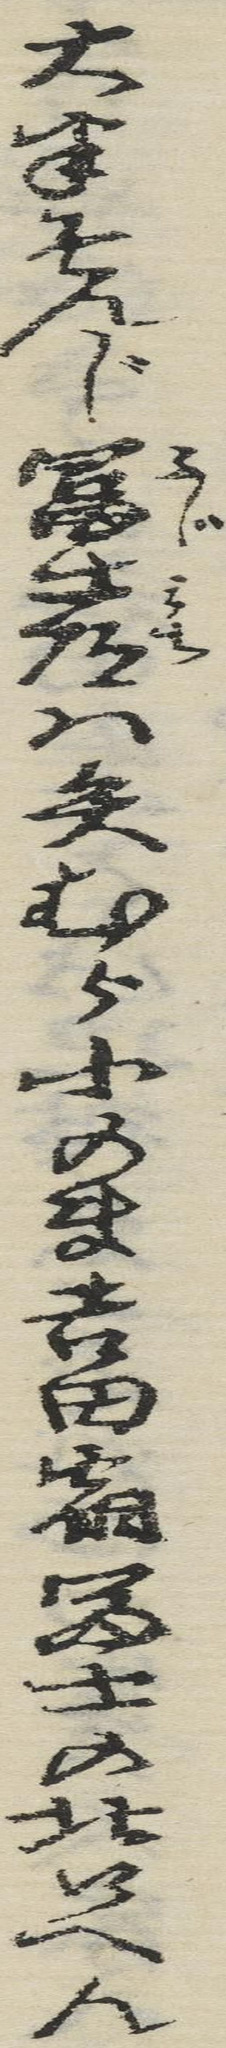大半そんじ富士道は矢むら小のま吉田宿冨士の北口へん
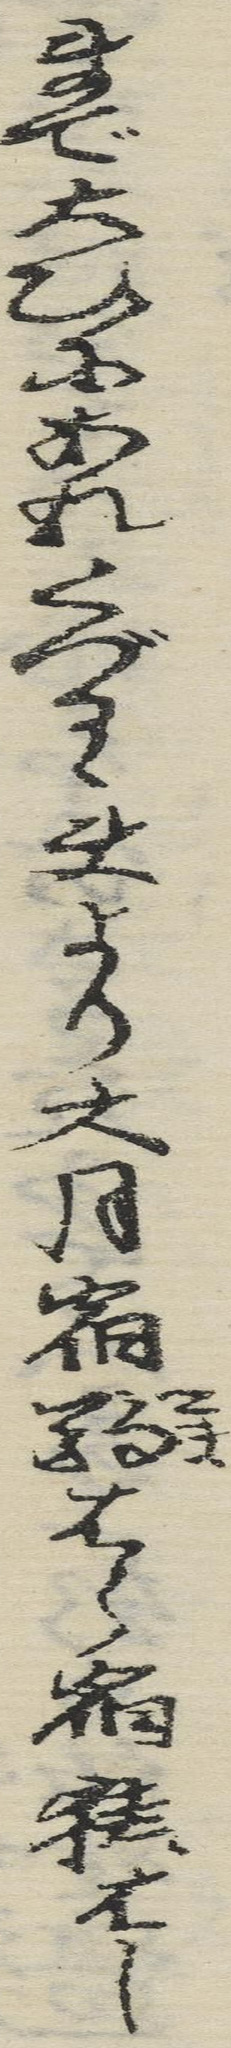まで大ひにあれくずるゝ夫より大月宿駒はし宿猿はし
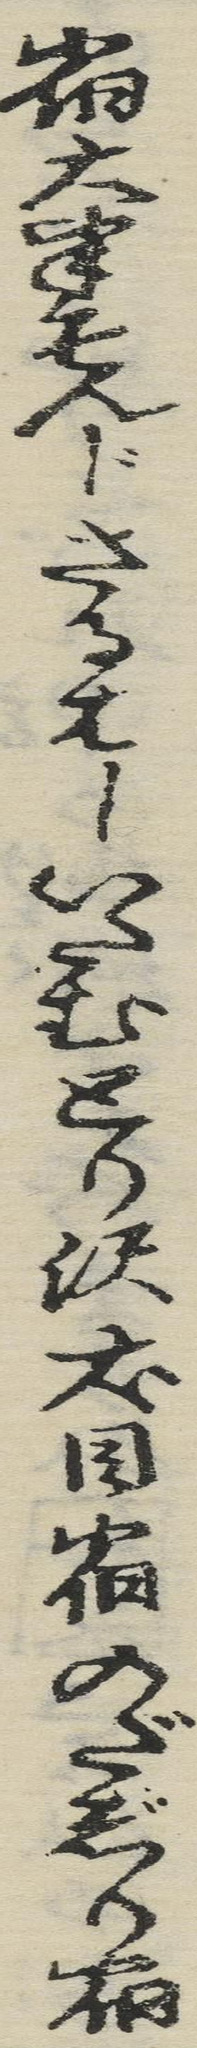宿大半そんじさるはしいたむとり沢犬目宿のだじり宿
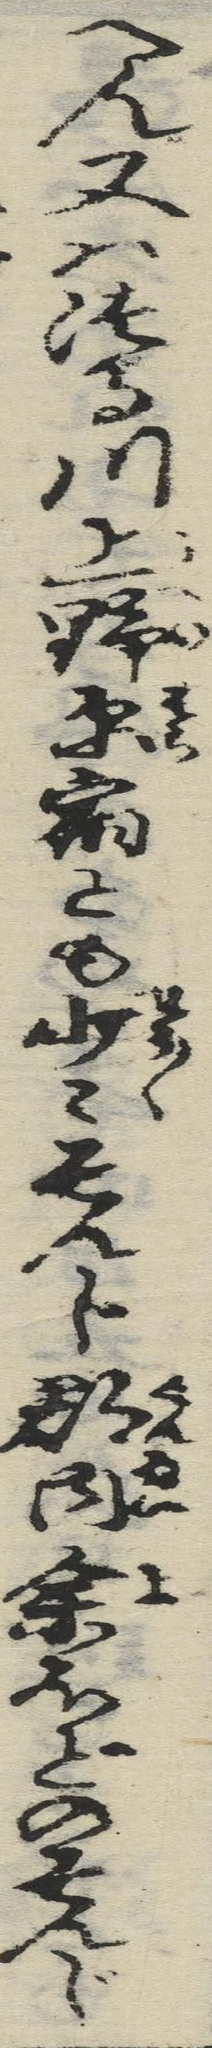へん又はつる川上野原宿とも少々そんじ郡内余ほどのそんじ
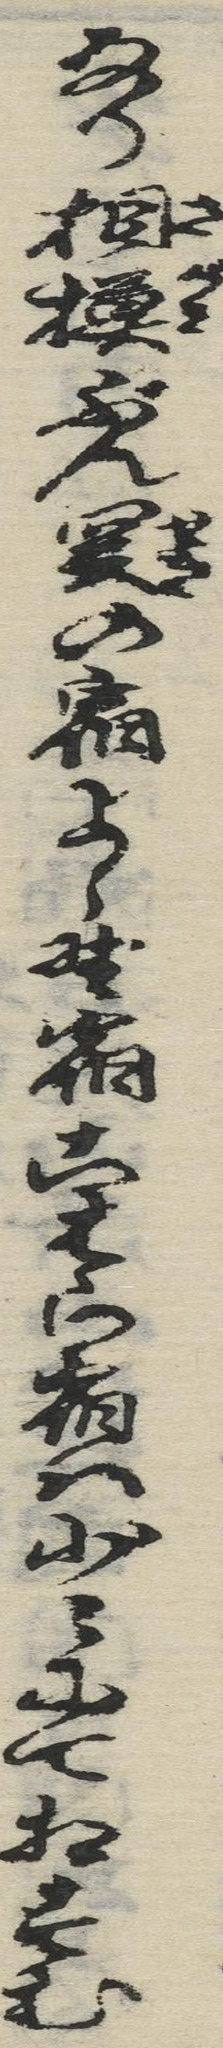なり相模ぶん関の宿よし野宿こはら宿は少々にて相すむ
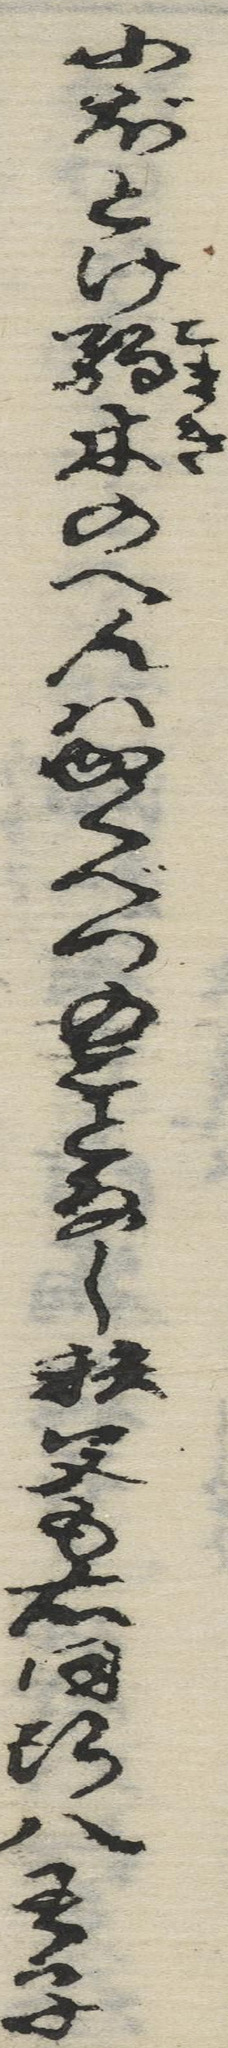小ぼとけ駒木のへんはかくべつのことなし秩父も右同断八王子
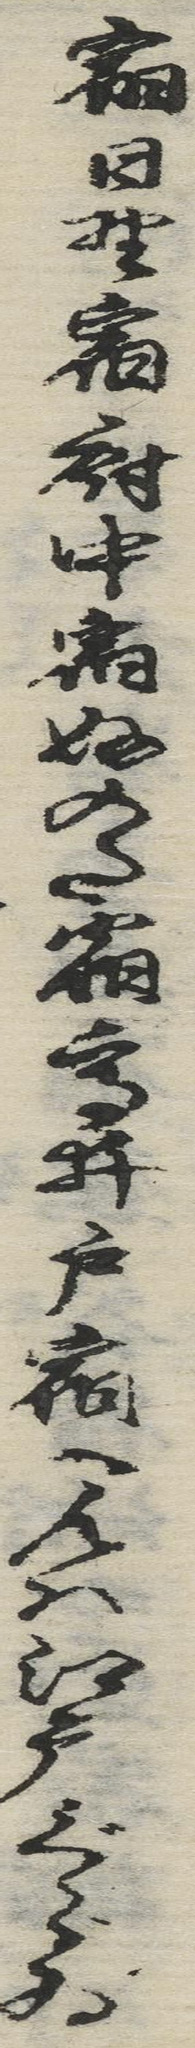宿日野宿府中宿ぬのた宿高井戸宿へんは江戸ぐらゐ
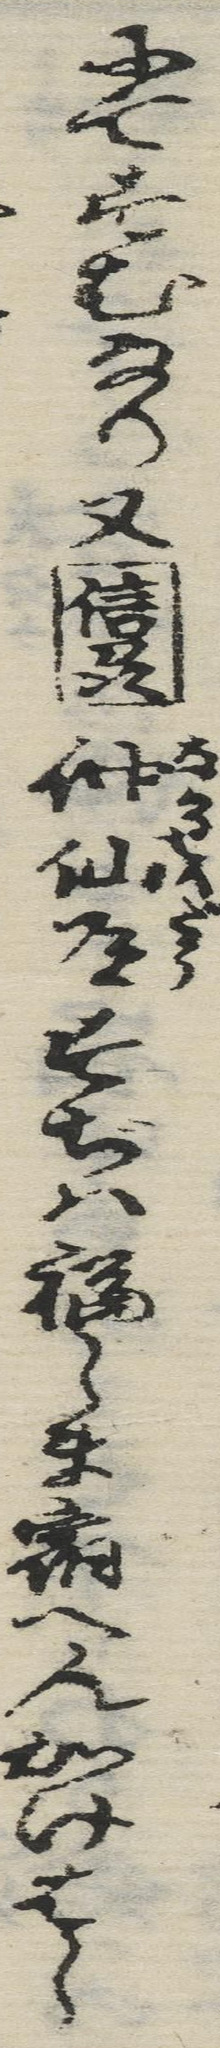にてすむなり又信州仲仙道すぢは福しま宿へんかけはし
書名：諸国海辺地震津波書
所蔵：東京大学地震研究所図書室 Earthquake Research Institute Library, The University of Tokyo, JAPAN
